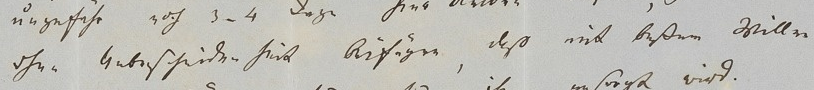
ohne Unbescheidenheit beifügen, daß mit bestem Willen
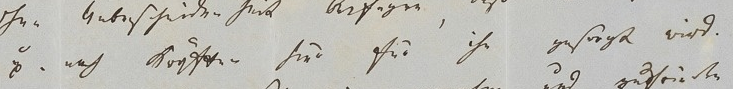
&. nach Kräften hier für ihn gesorgt wird.
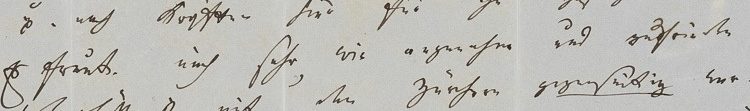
Es freut mich sehr, wie angenehm und zufrieden
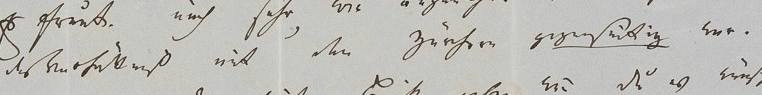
das Verhältniß mit den Zürcherngegenseitig war.
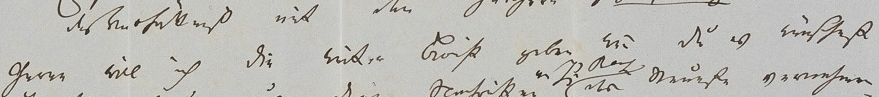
Gerne will ich Dir weiter Bericht geben wenn Du es wünschest
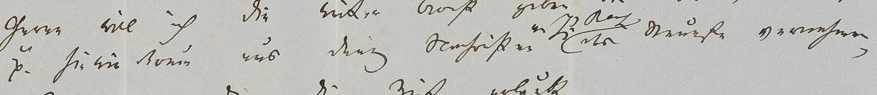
&. hinwiederum aus Deinen Nachrichten an Hr. Benz das Neueste vernehmen,
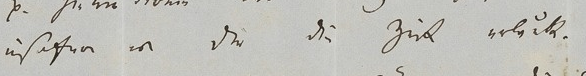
insofern es Dir die Zeit erlaubt.
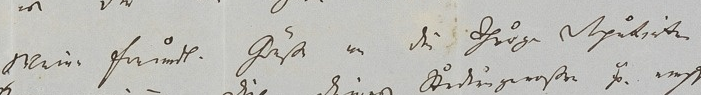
Meine freundl. Grüße an die Thurg. Deputirten
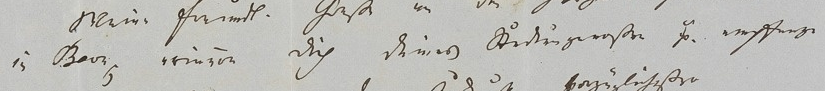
in Bern, erinnere Dich Deines Studiengenossen &. empfange
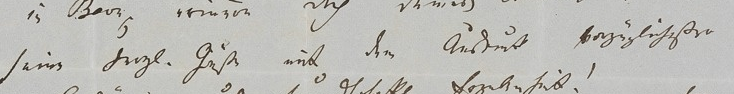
seine herzl. Grüße mit dem Ausdruck vorzüglichster
